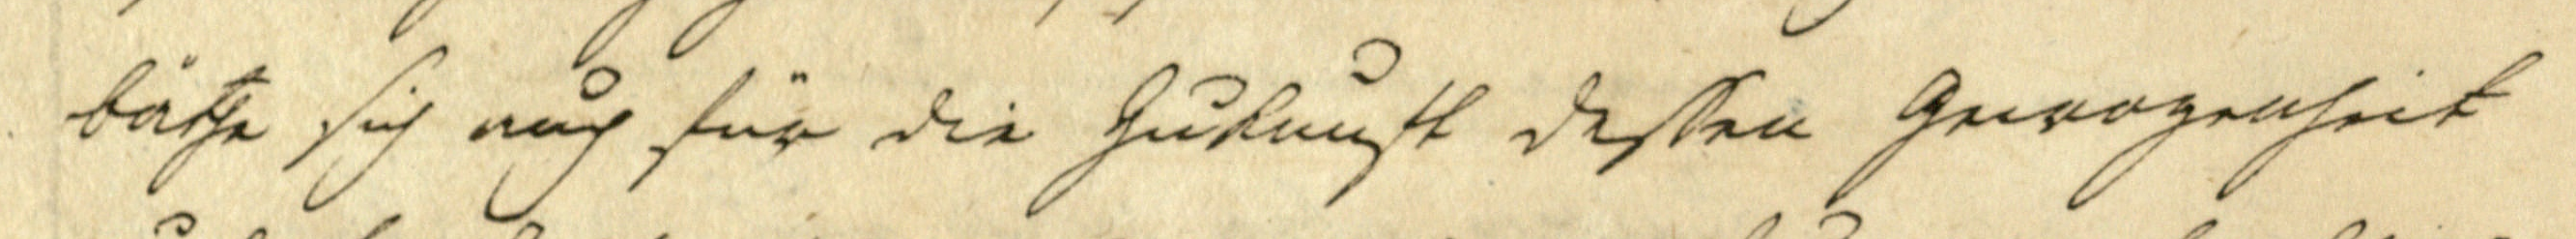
bäthe sich auf für die Zukunft dessen Gewogenheit
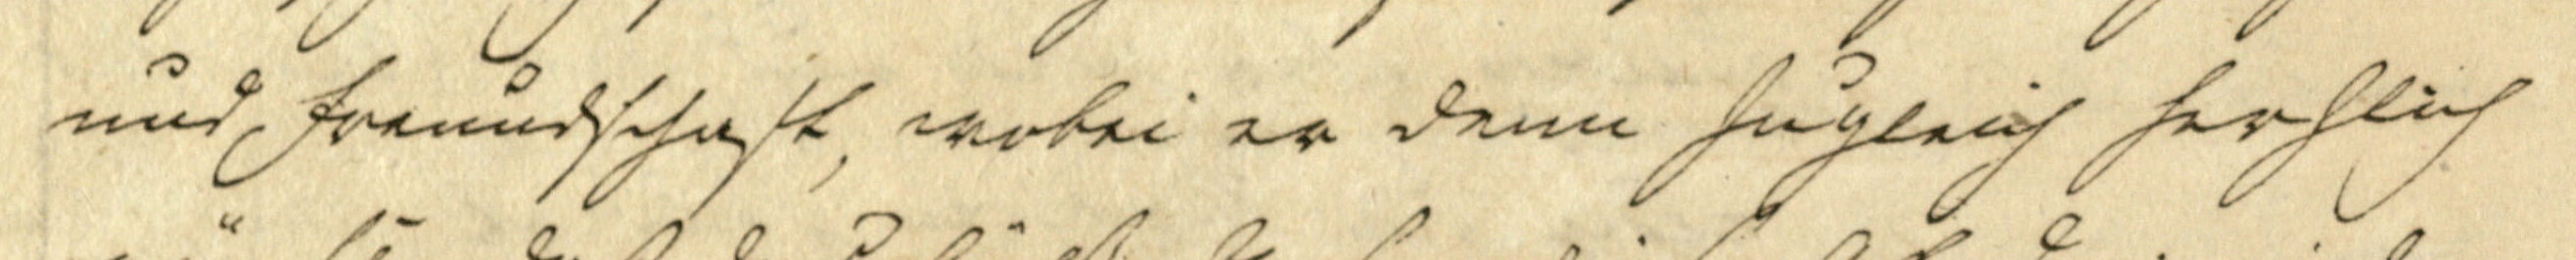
und Freundschaft, wobei er denn zugleich herzlich
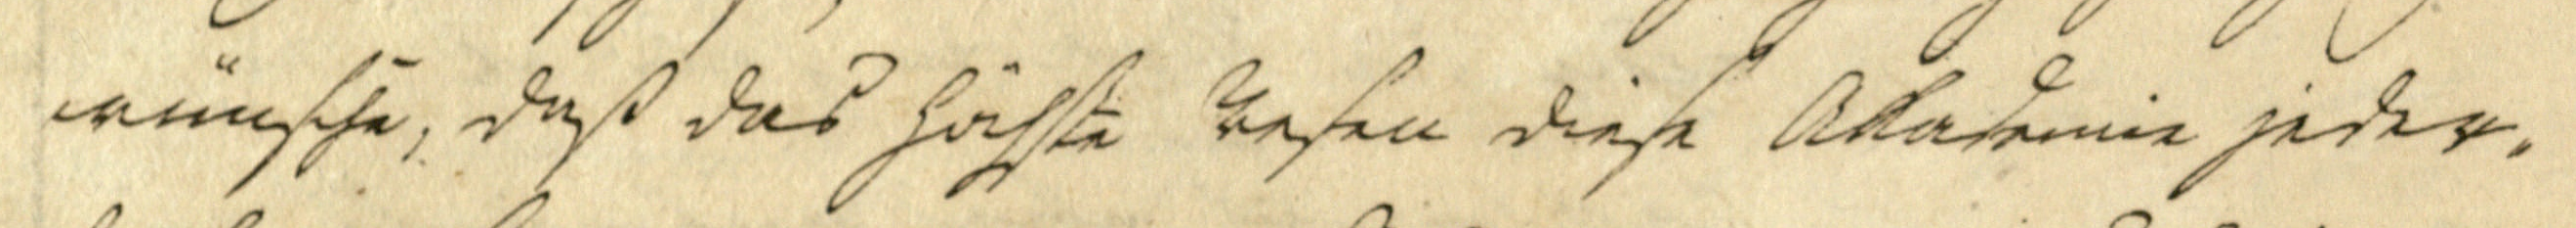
wünsche, daß das Höchste Wesen diese Akademie jeder¬
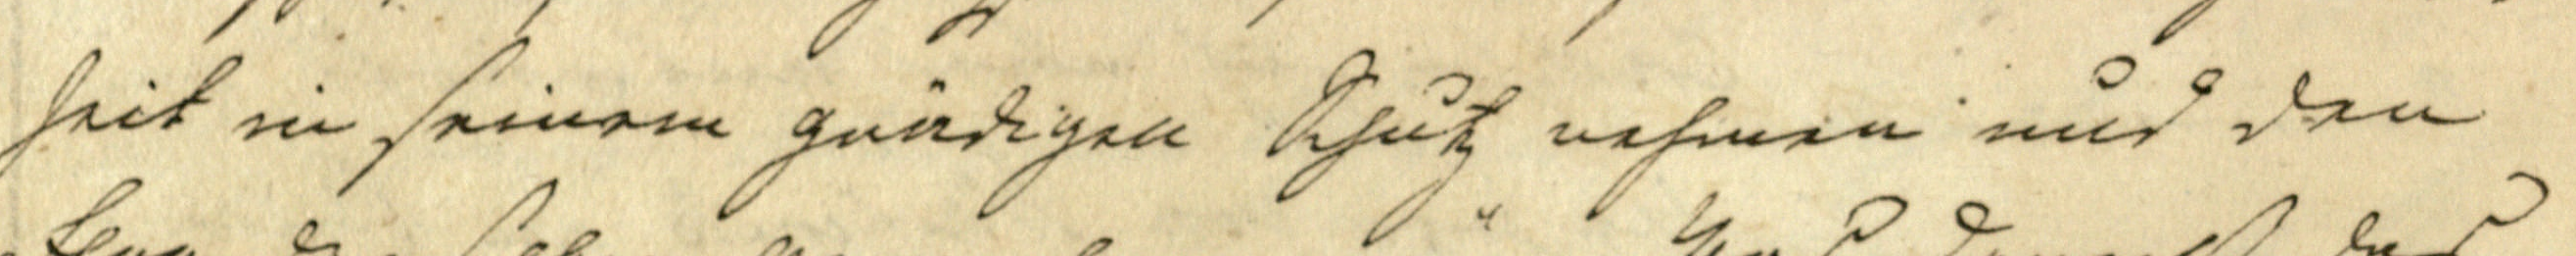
zeit in seinem gnädigen Schutz nehmen und den
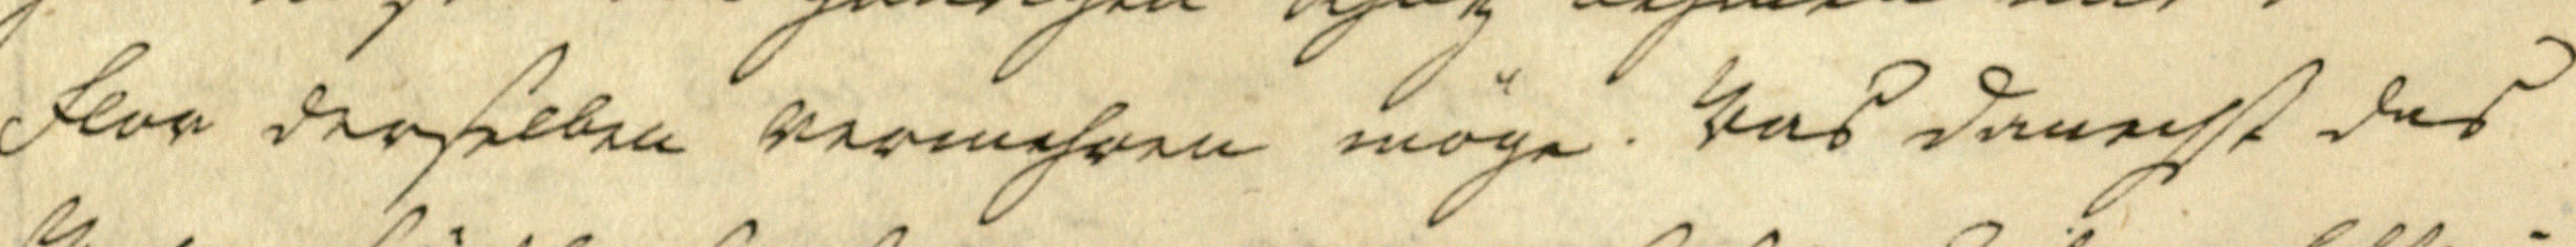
Flor derselben vermehren möge. Was danechst das
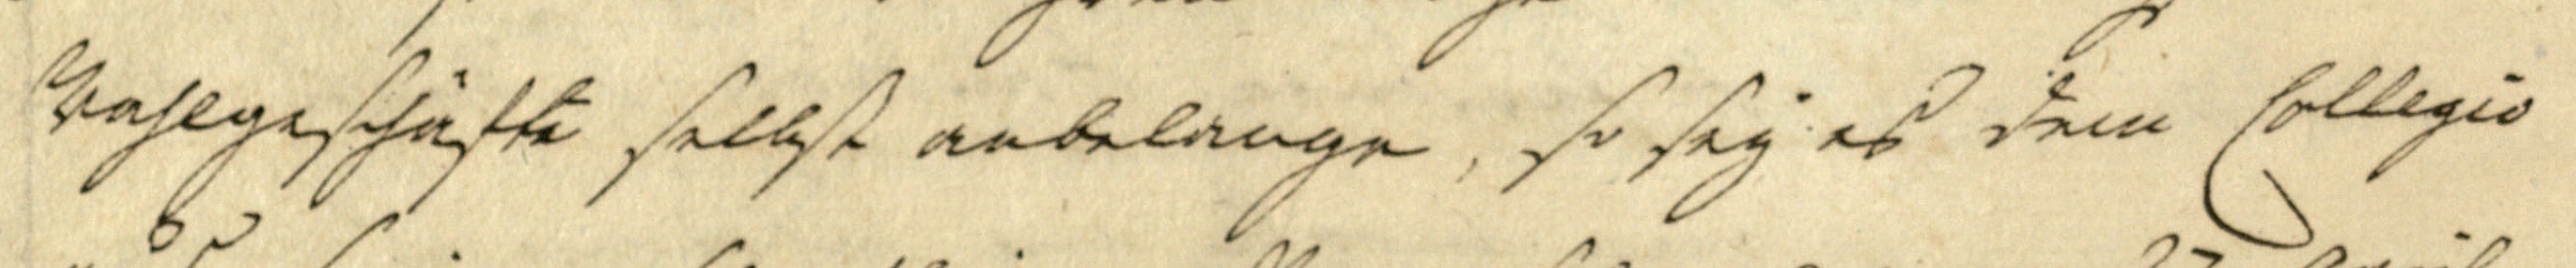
Wahlgeschäfte selbst anbelange, so seÿ es dem Collegio
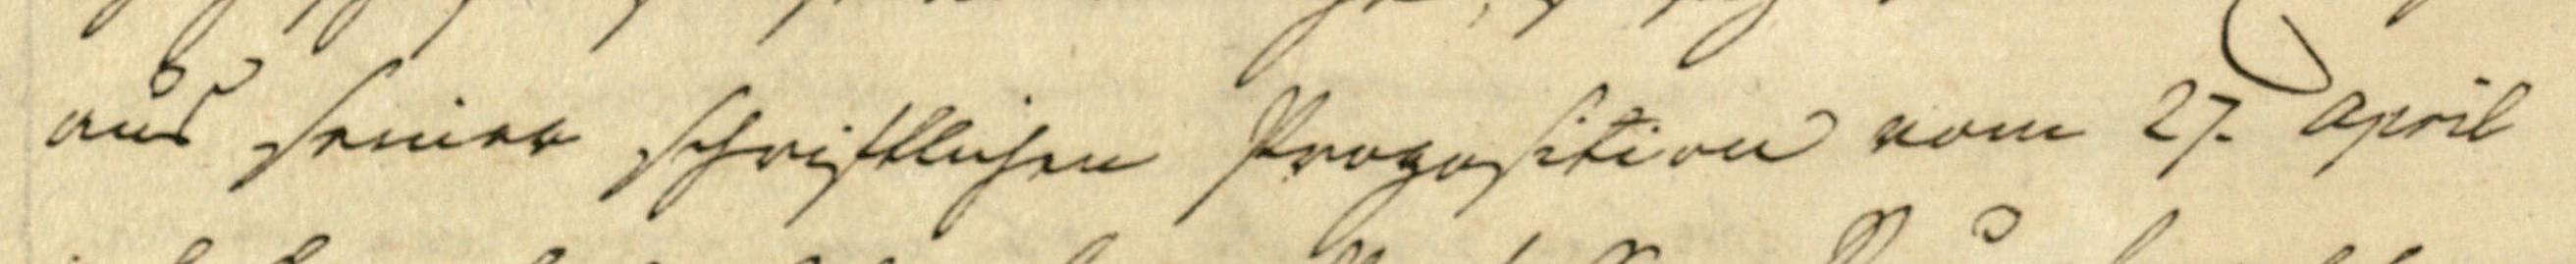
aus seiner schriftlichen Proposition vom 27. April
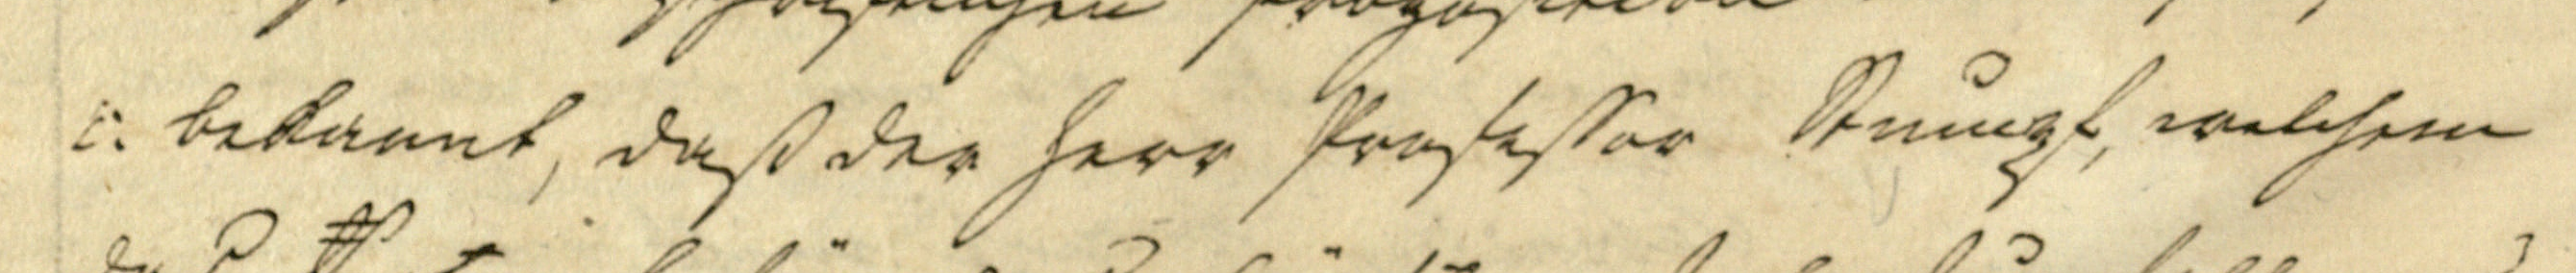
c. bekannt, daß der Herr Professor Stumpf, welchem
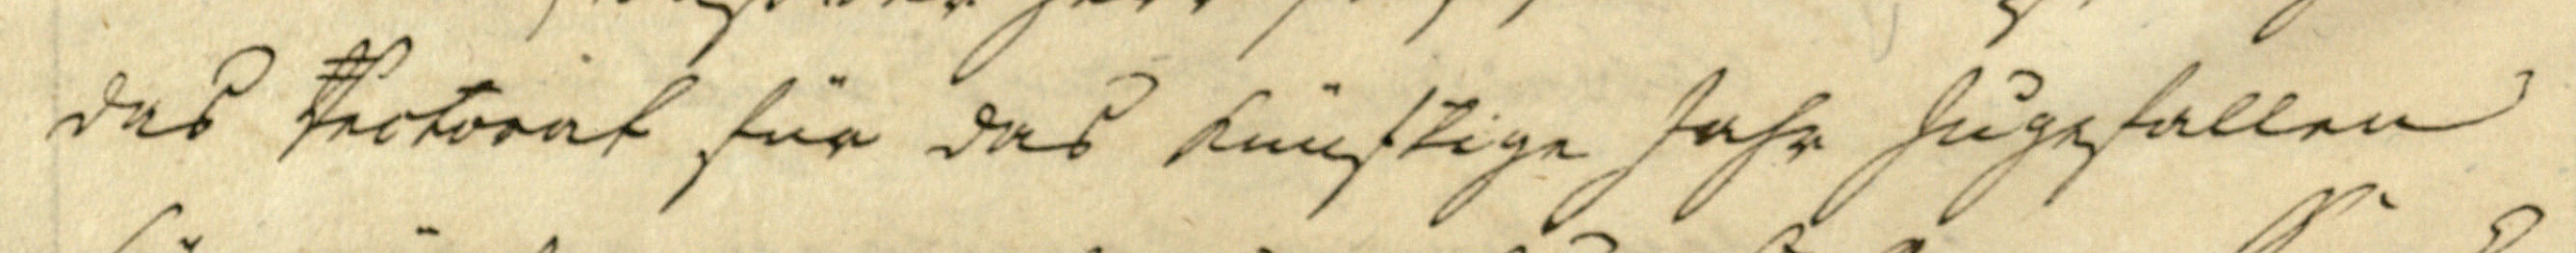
das Rectorat für das künftige Jahr zugefallen
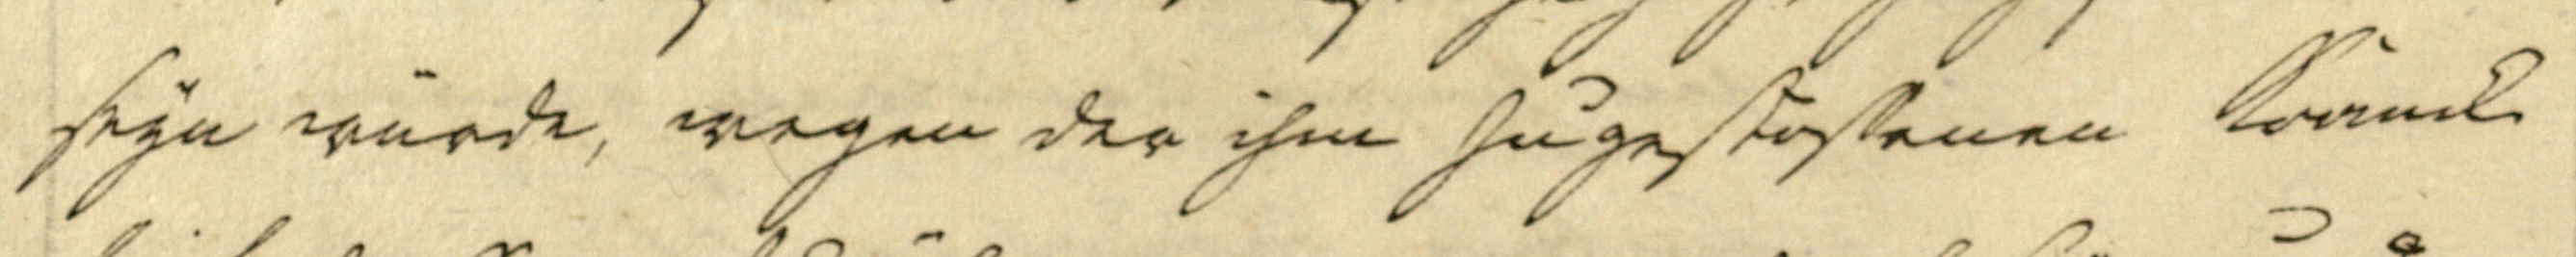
seÿn würde, wegen der ihm zugestossenen Kranck¬
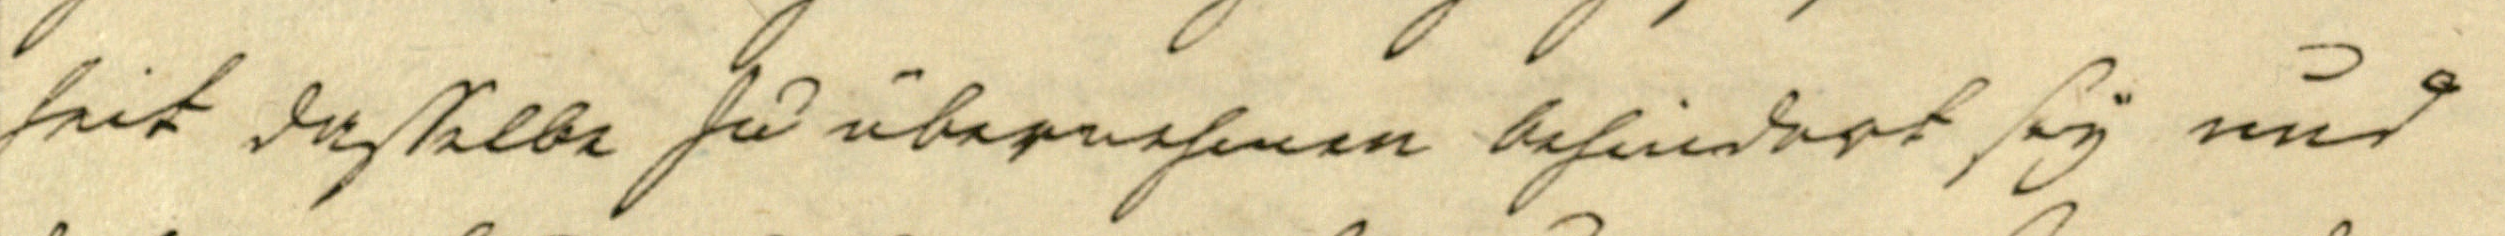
heit dasselbe zu übernehmen behindert seÿ und
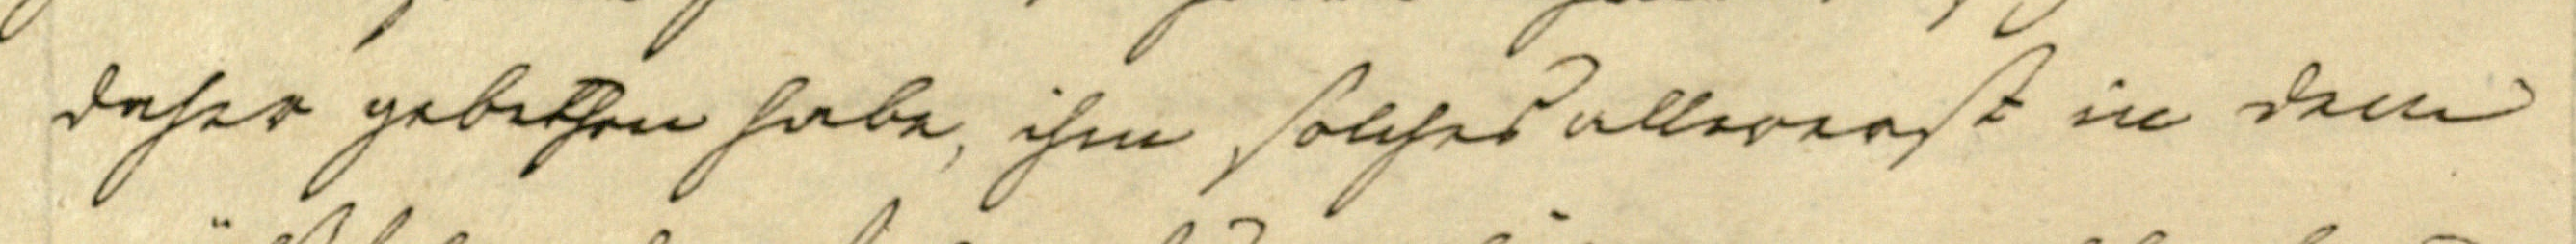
daher gebethen habe, ihm solches allererst in dem
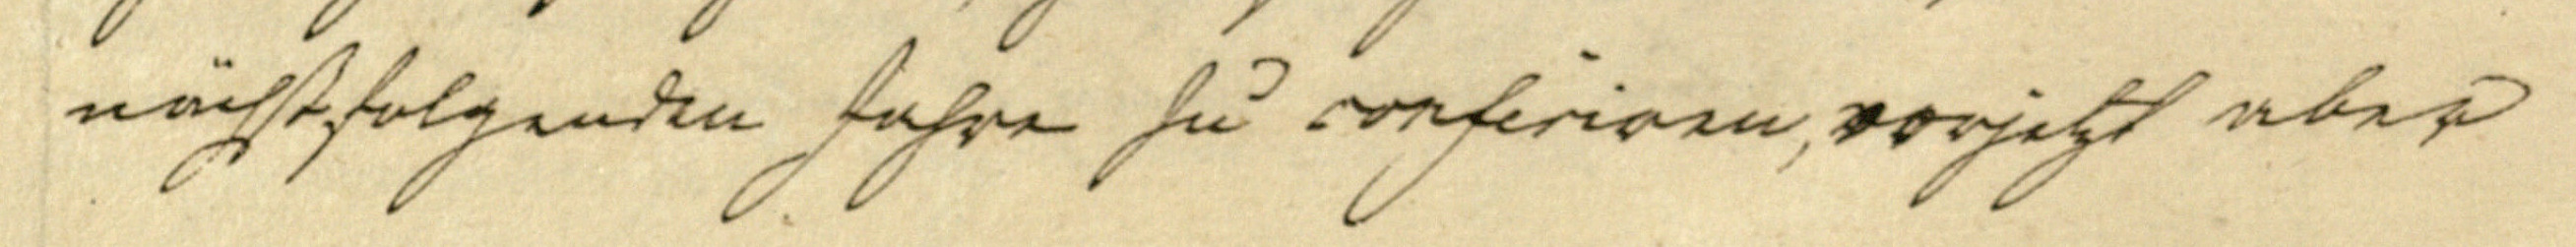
nächstfolgenden Jahre zu conferiren vorjetzt aber
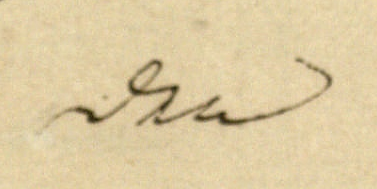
den
